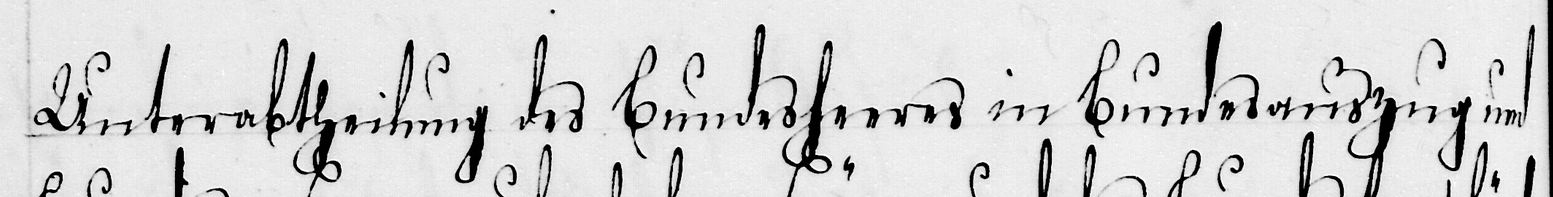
Unterabtheilung des Bundesheeres in Bundesauszug und
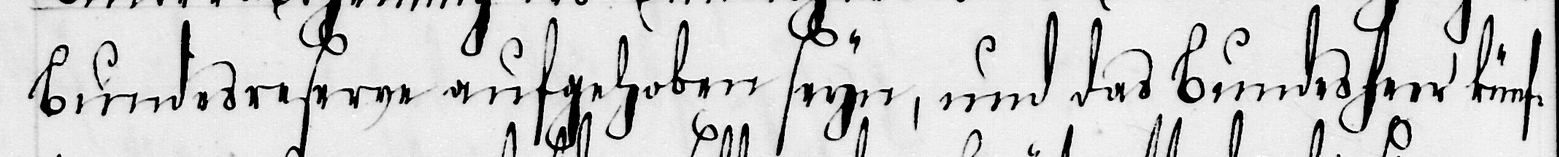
Bundesreserve aufgehoben seyn, und das Bundesheer kün¬
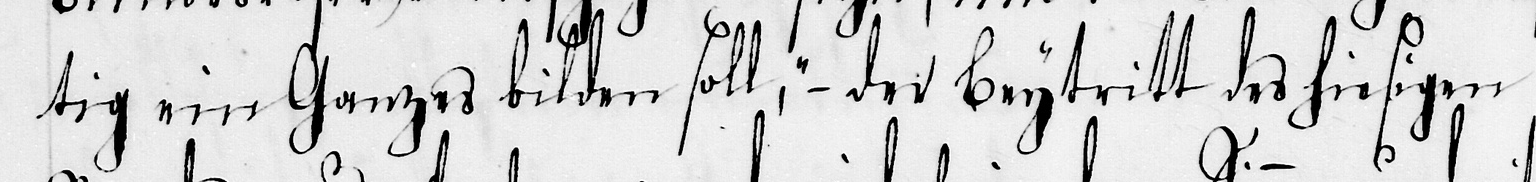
ftig ein Ganzes bilden soll,“ – der Beytritt des hiesigen
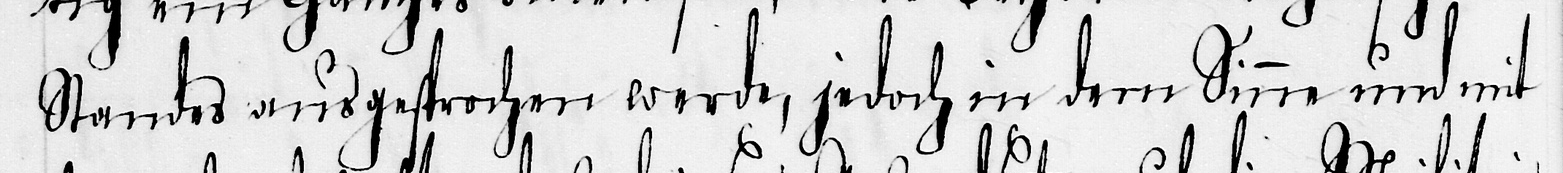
Standes ausgesprochen werde, jedoch in dem Sinne und mit
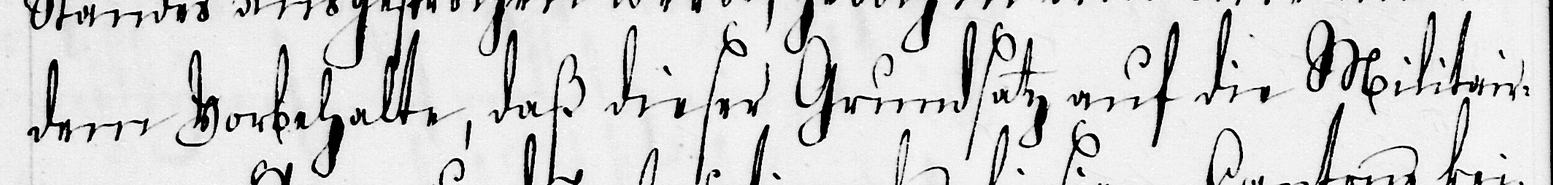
dem Vorbehalte, daß dieser Grundsatz auf die Militai¬
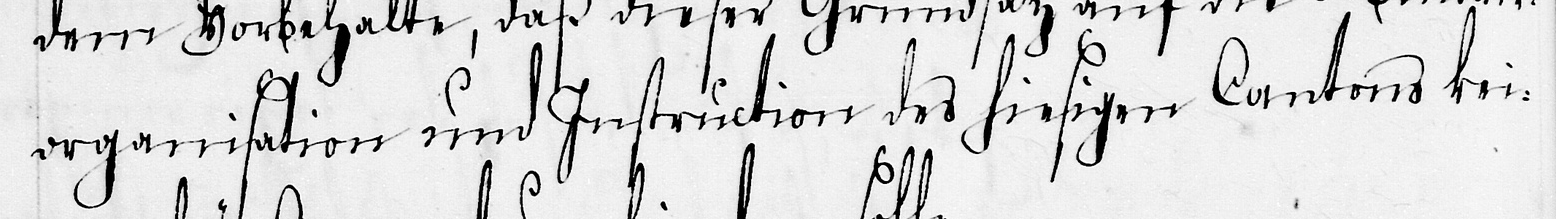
rorganisation und Instruction des hiesigen Cantons kei¬
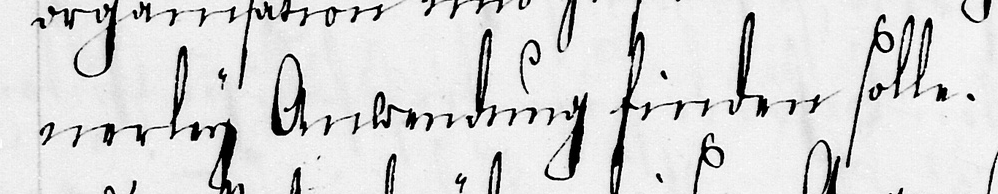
nerley Anwendung finden solle.
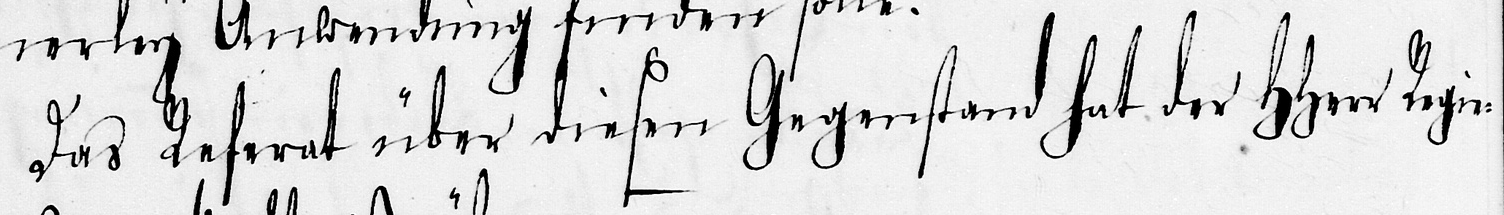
Das Referat über diesen Gegenstand hat der HHerr Re¬
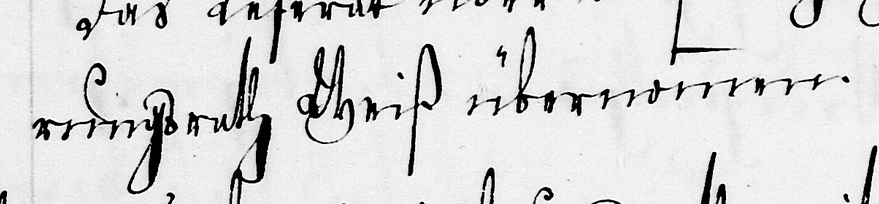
rungsrath Weiß übernommen.
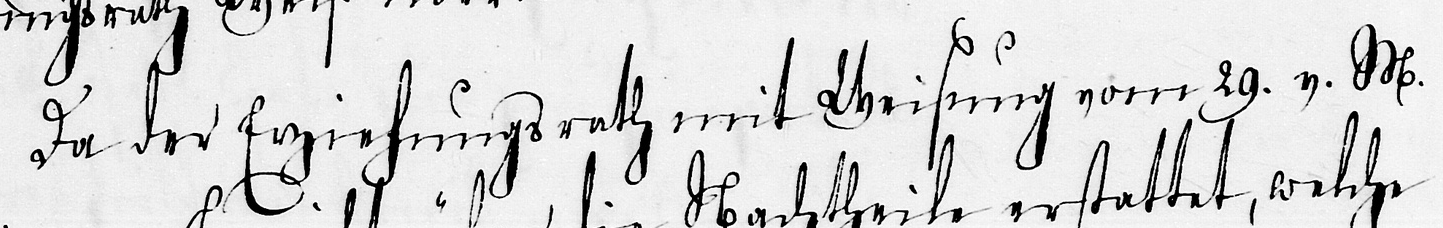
Da der Erziehungsrath mit Weisung vom 29. v. M.
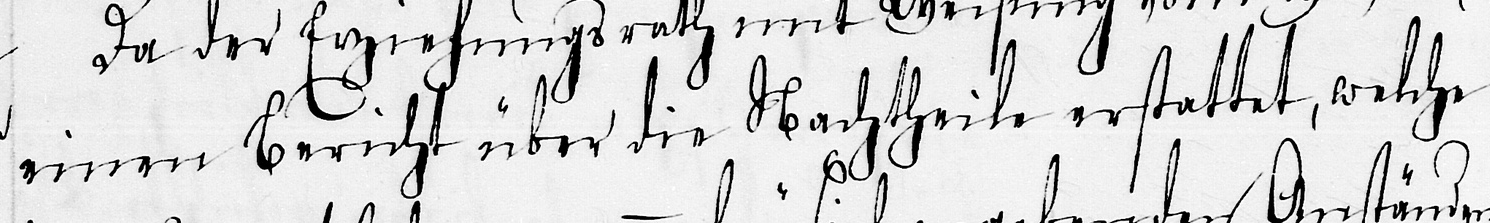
einen Bericht über die Nachtheile erstattet, welche
